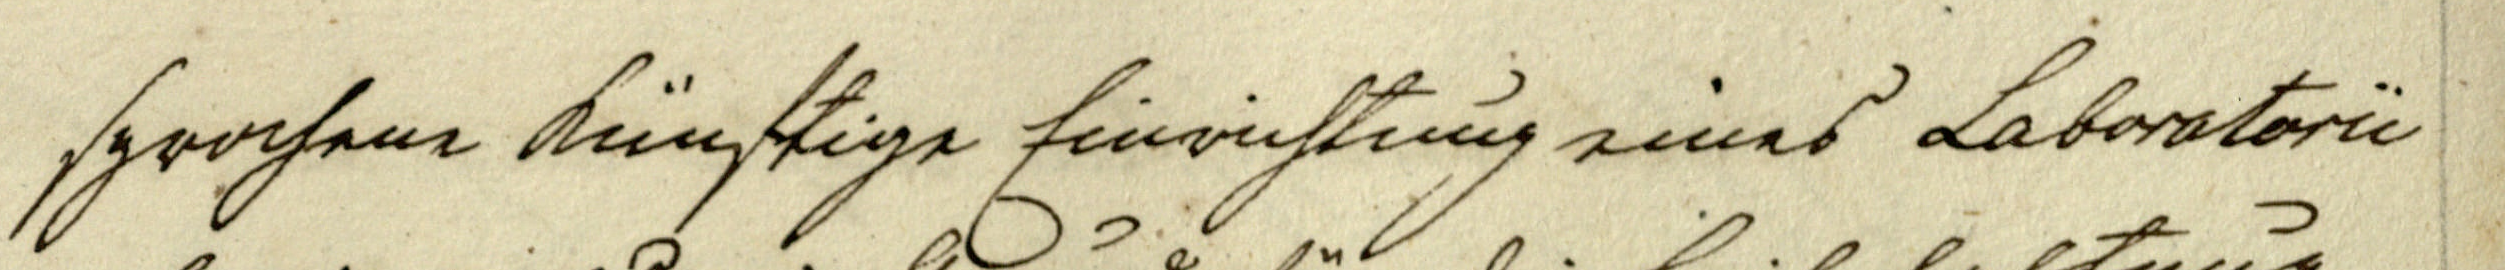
sprochene künftige Einrichtung eines Laboratorii
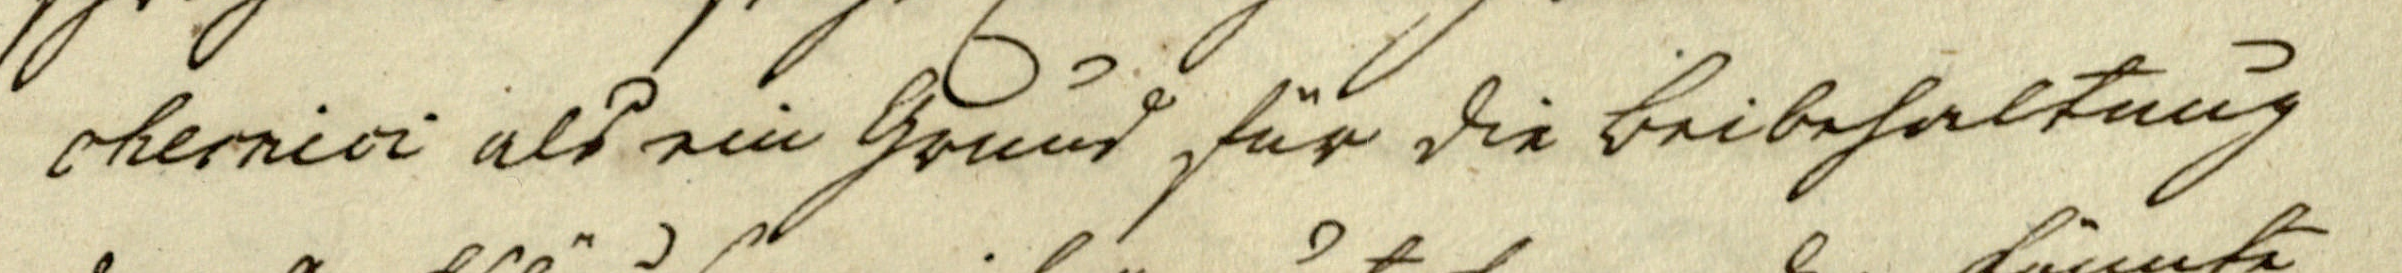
chemici als ein Grund für die Beibehaltung
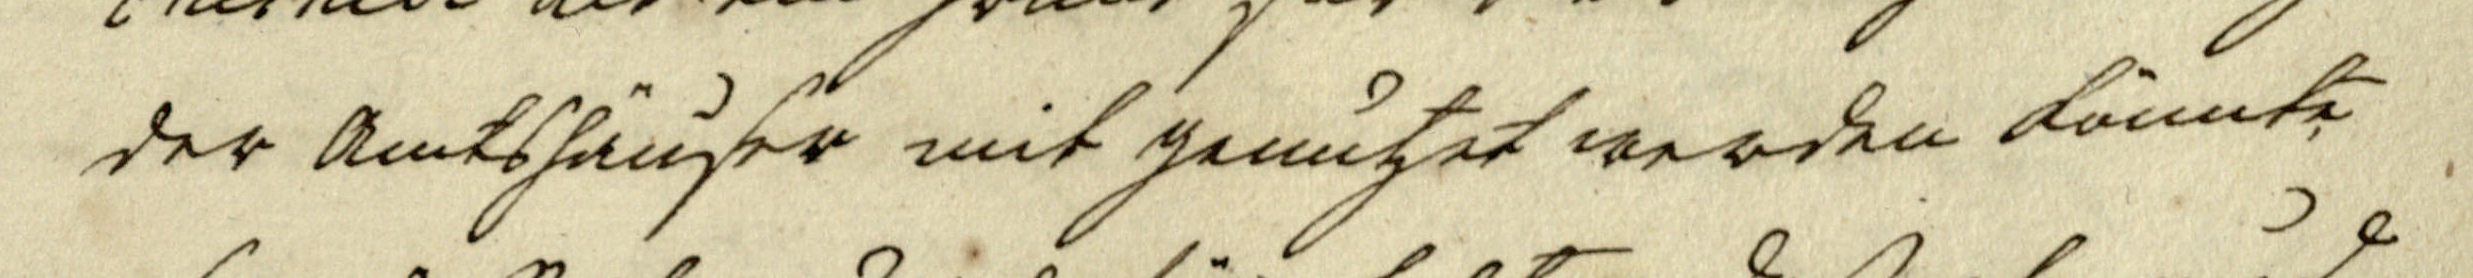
der Amtshäuser mit genutzet werden könnte,
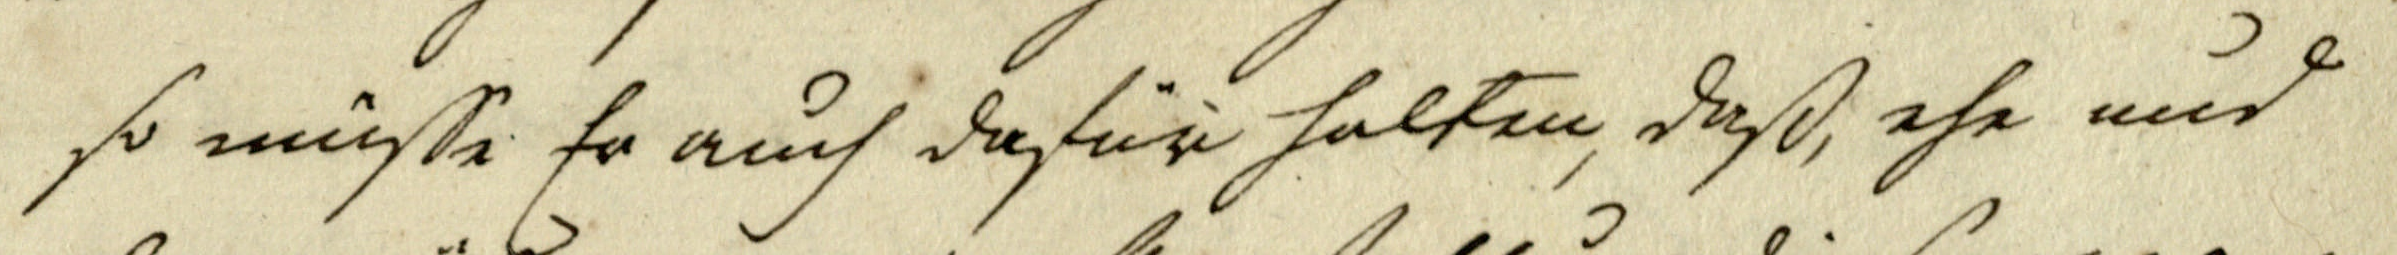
so müsse Er auch dafür halten, daß, ehe und
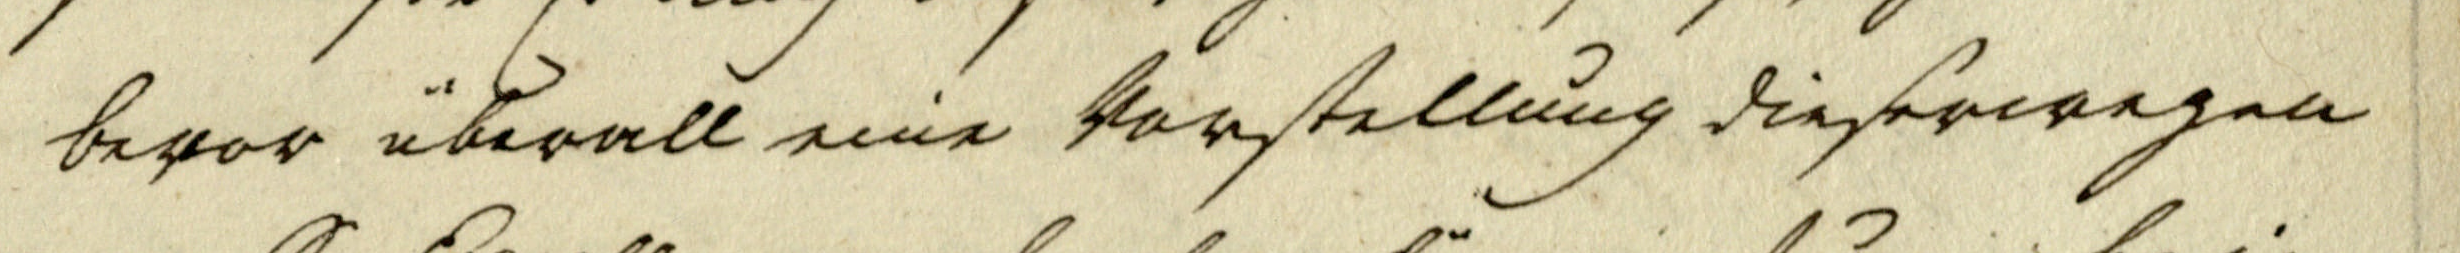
bevor überall eine Vorstellung dieserwegen
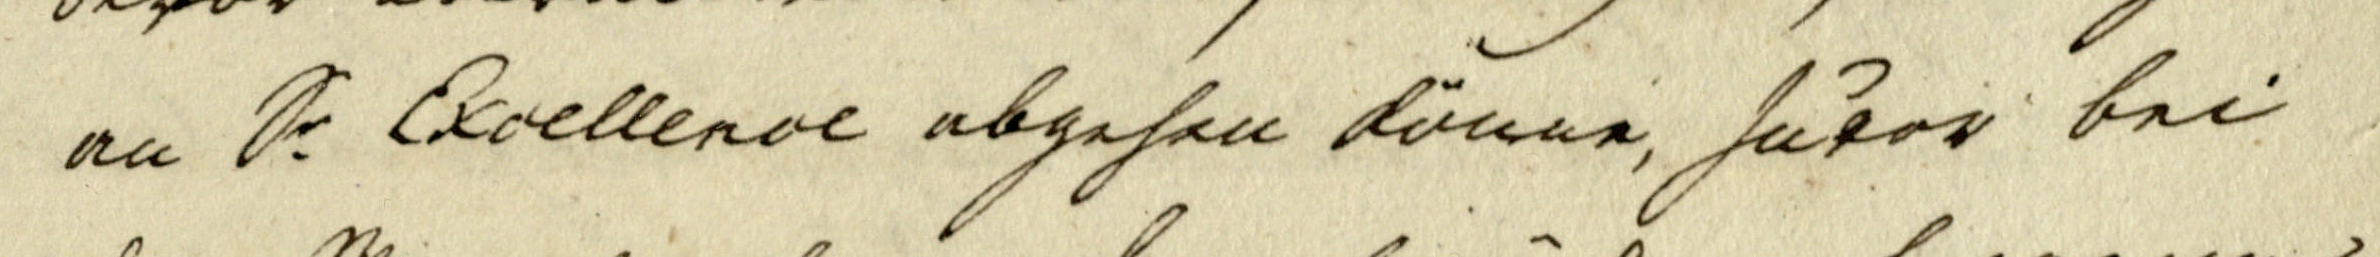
an Sr Excellence abgehen könne, zuvor bei
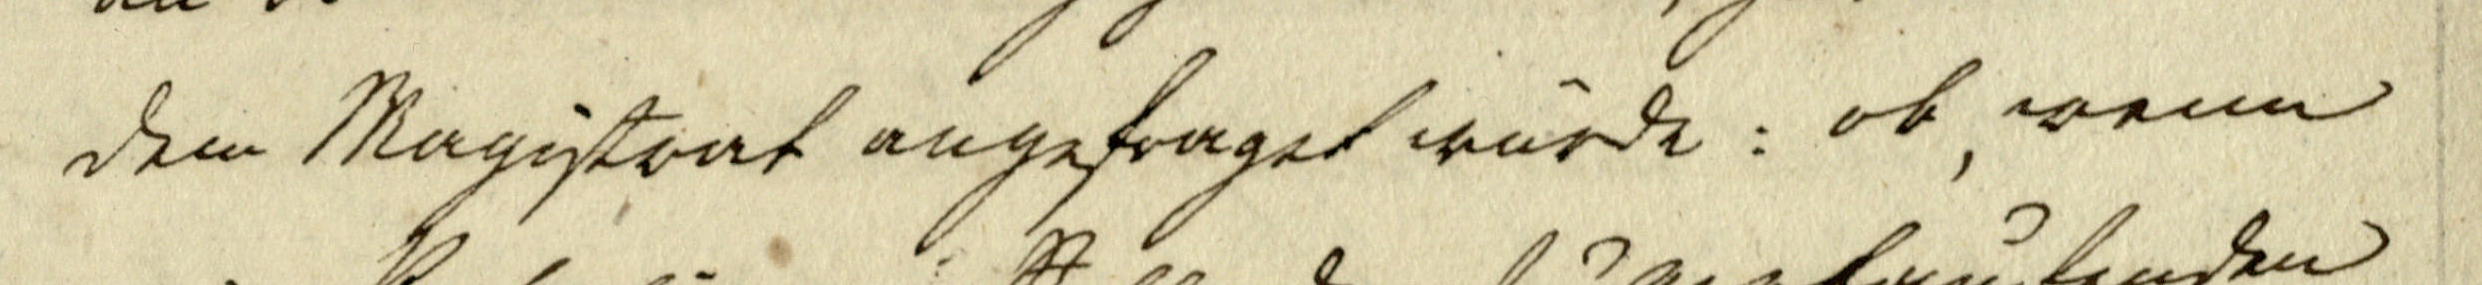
dem Magistrat angefraget würde: ob, wenn
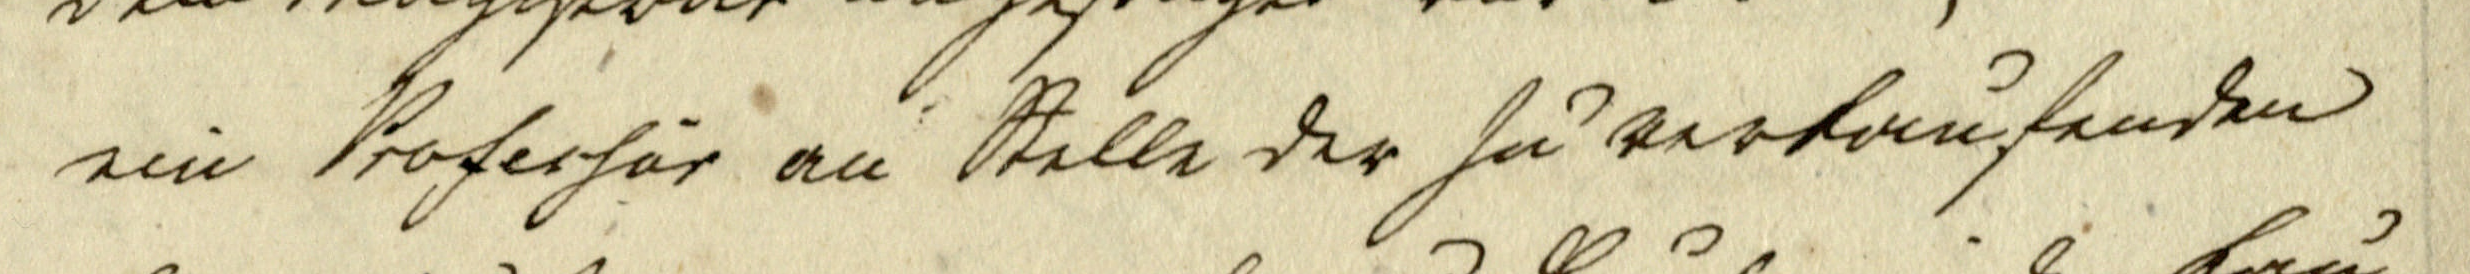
ein Professor an Stelle der zu verkaufenden
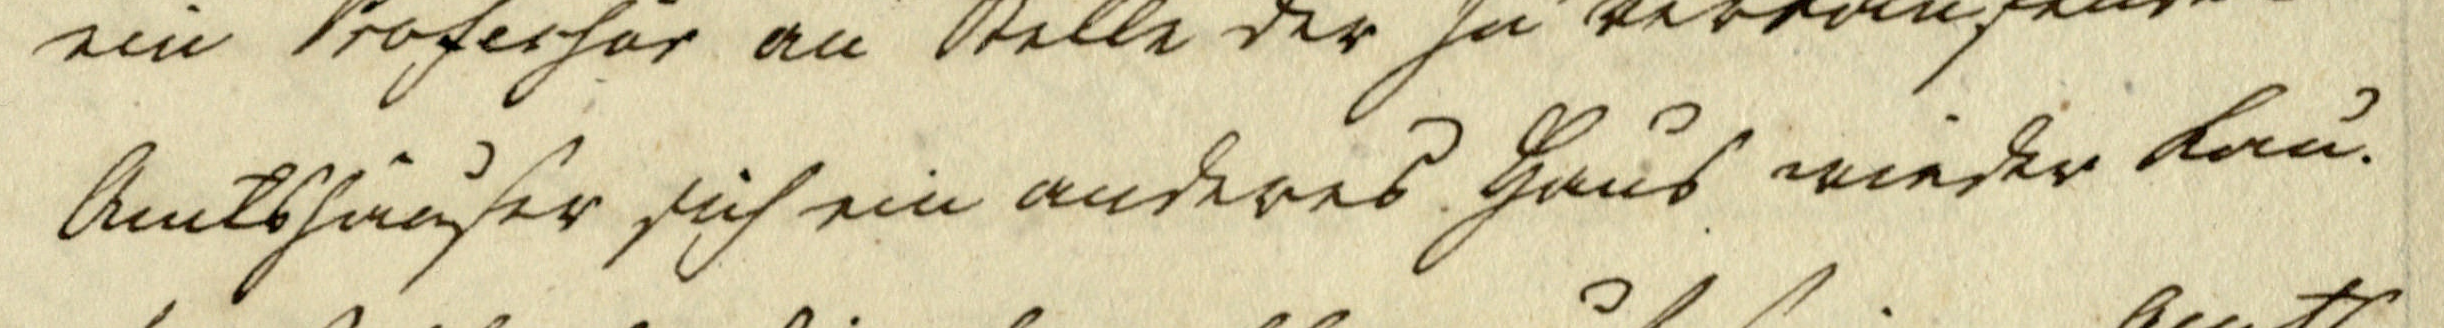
Amtshäuser sich ein anderes Haus wieder kau¬
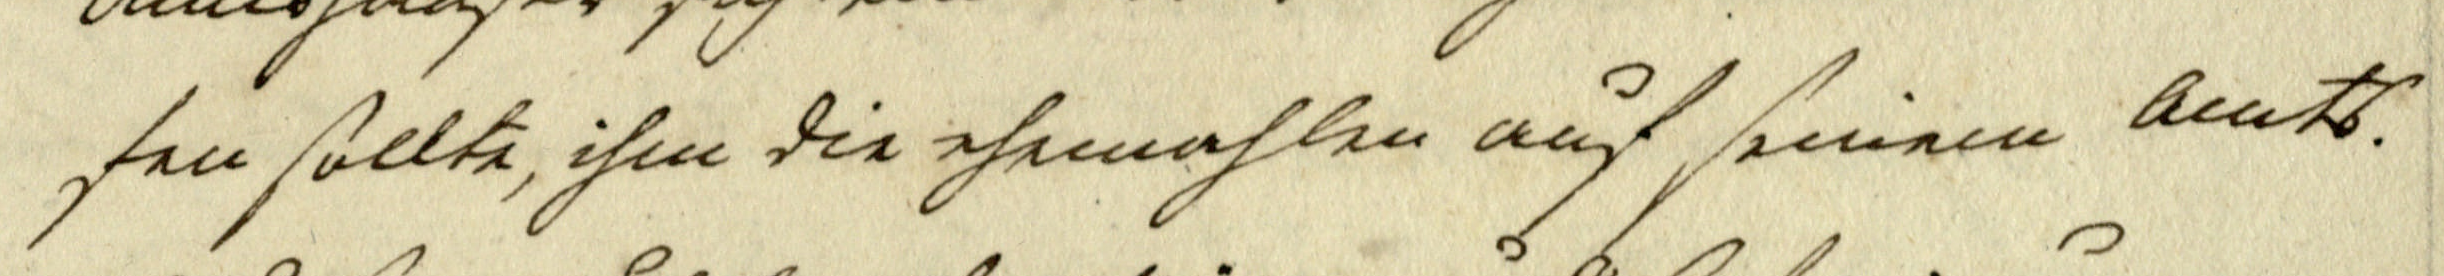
fen sollte, ihm die ehemahlen auf seinem Amts¬
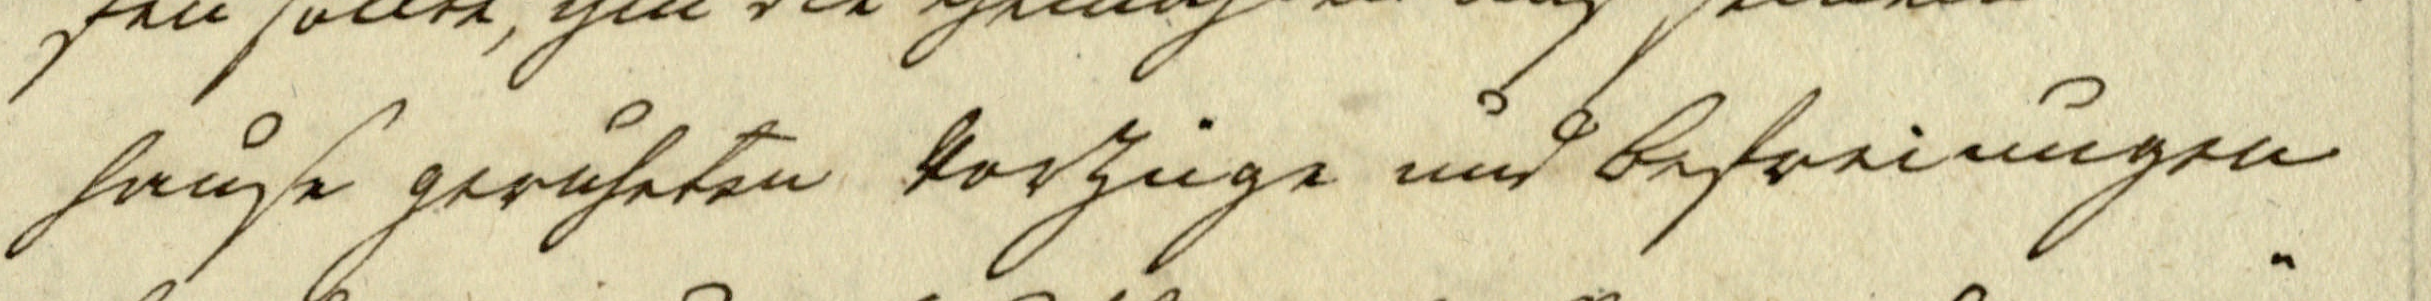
hause geruheten Vorzüge und Befreiungen
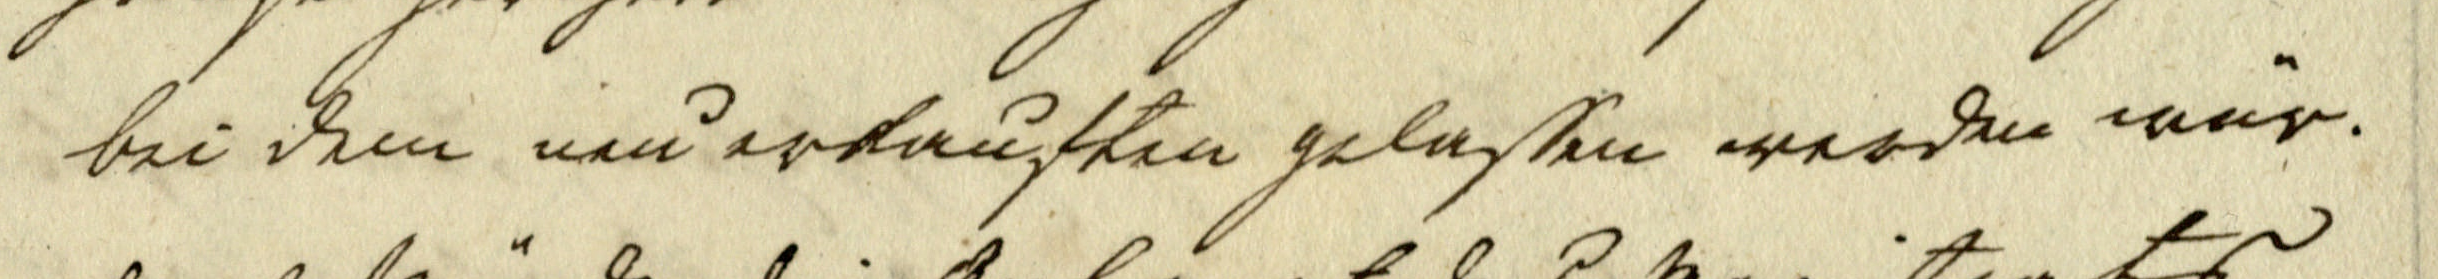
bei dem neu erkauften gelassen werden wür¬
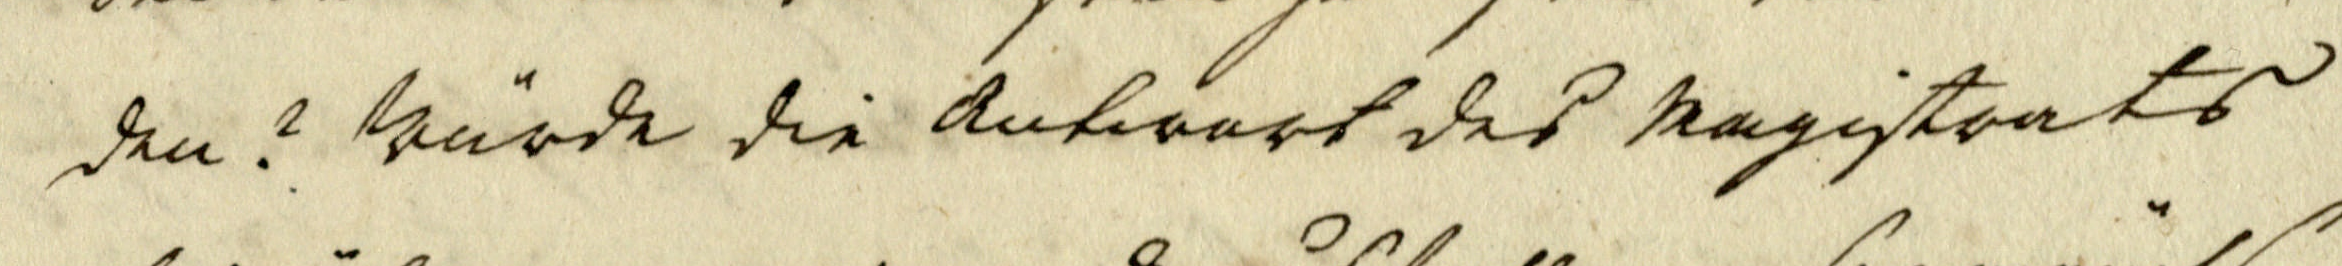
den? Würde die Antwort des Magistrats
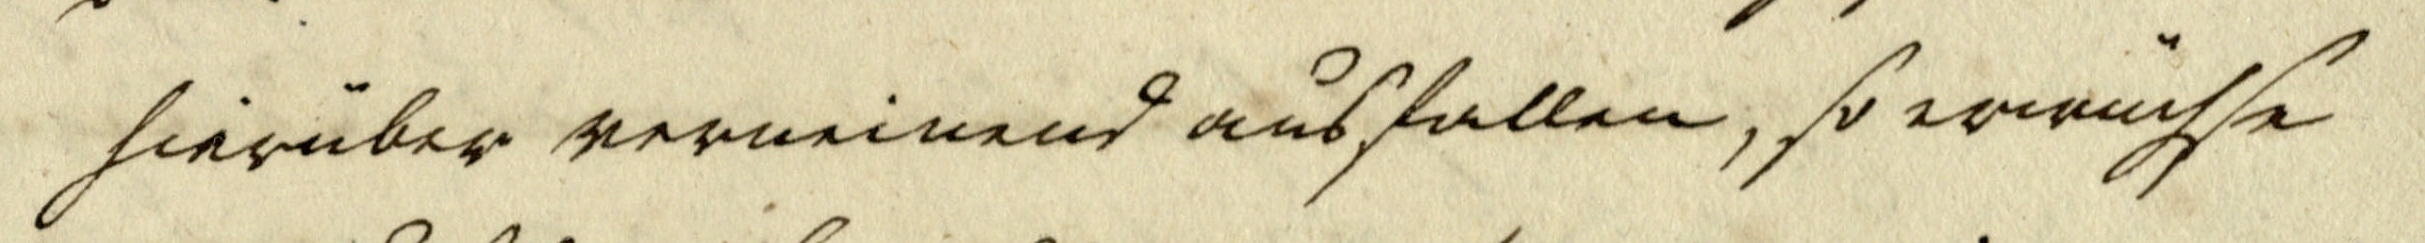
hierüber verneinend ausfallen, so erwüchse
